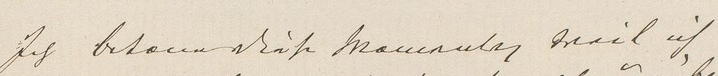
Ich betone diese Momente, weil ich
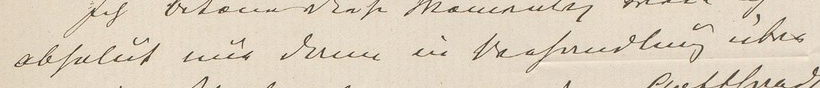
absolut nur dann in Verhandlung über
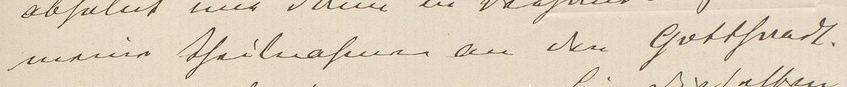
meine Theilnahme an den Gotthardt -
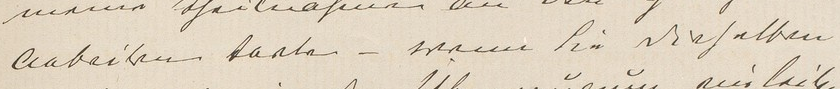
arbeiten trete – wenn Sie dieselben
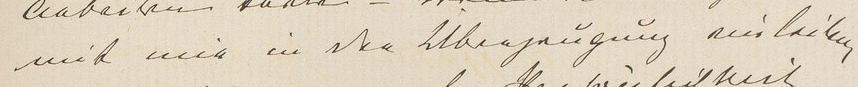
mit mir in der Überzeugung einleiten,
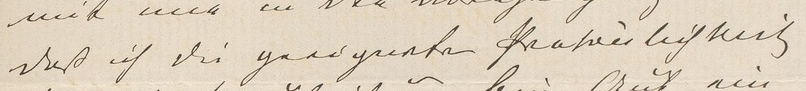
daß ich die geeignete Persönlichkeit
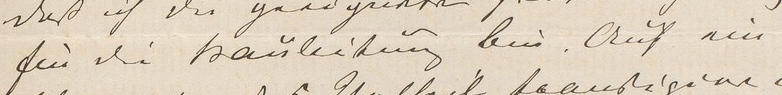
für die Bauleitung bin. Auf ein
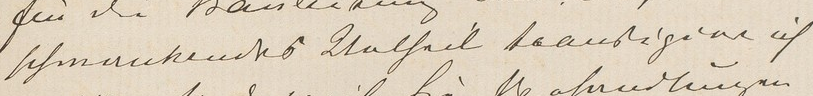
schwankendes Urtheil transigire ich
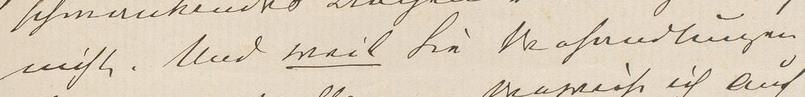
nicht. Und weil Sie Verhandlungen
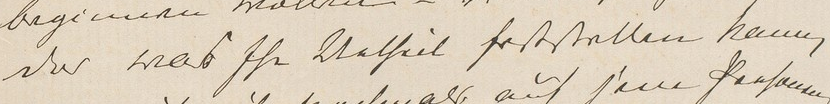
das was Ihr Urtheil feststellen kann,
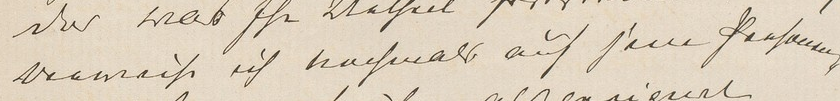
verweise ich nochmals auf jene Personen,
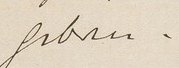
geben.
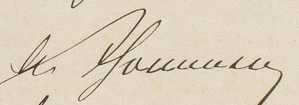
A. Thommen
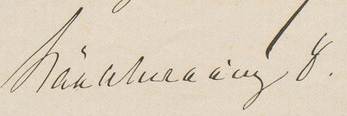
Kärntnerring 8.
